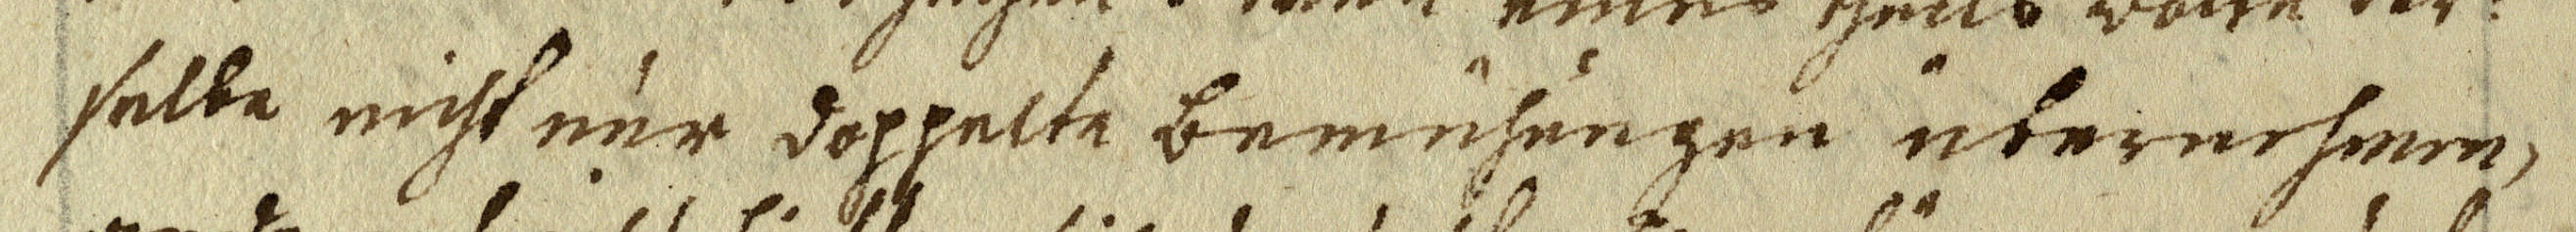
selbe nicht nur doppelte Bemühungen übernehmen,
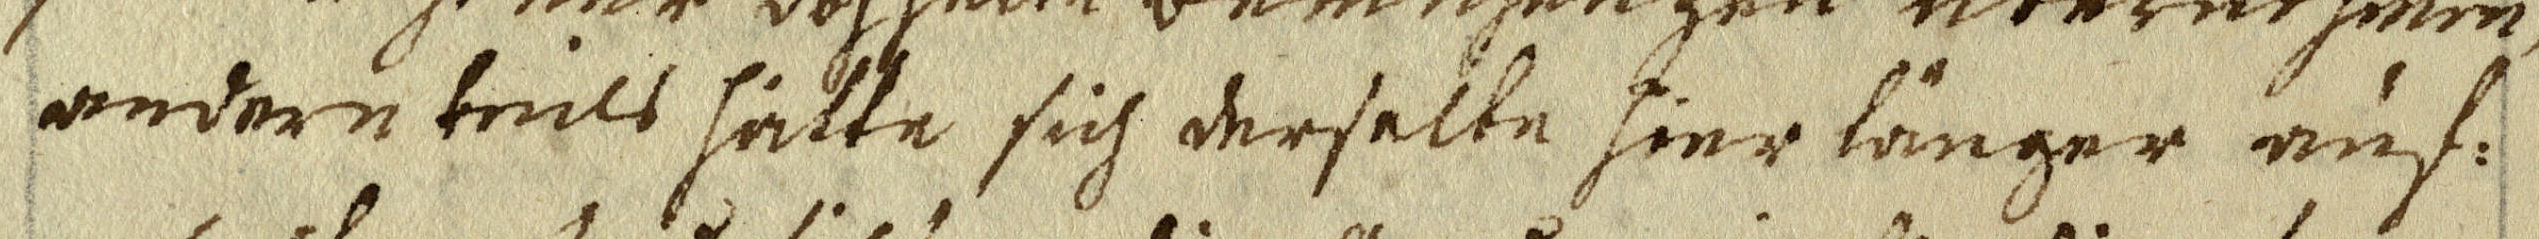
andern teils hätte sich derselbe hier länger auf¬
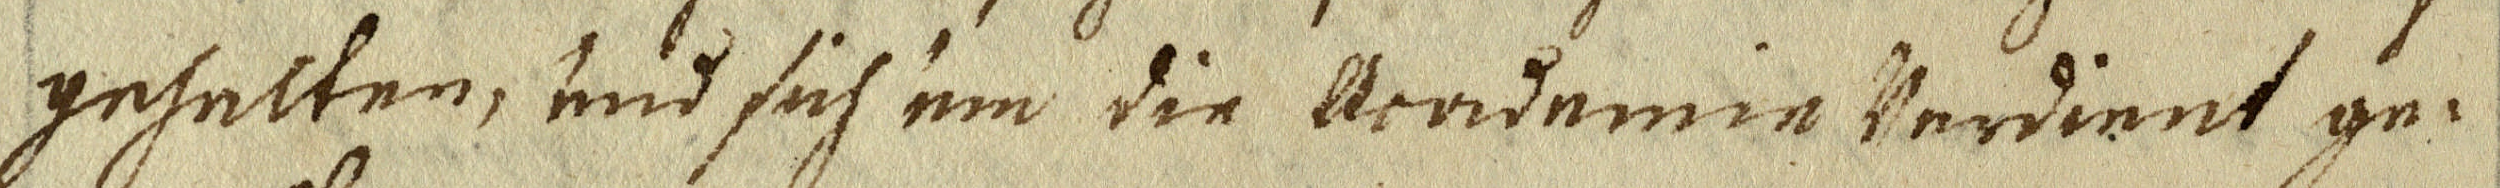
gehalten und sich um die Academie verdient ge¬
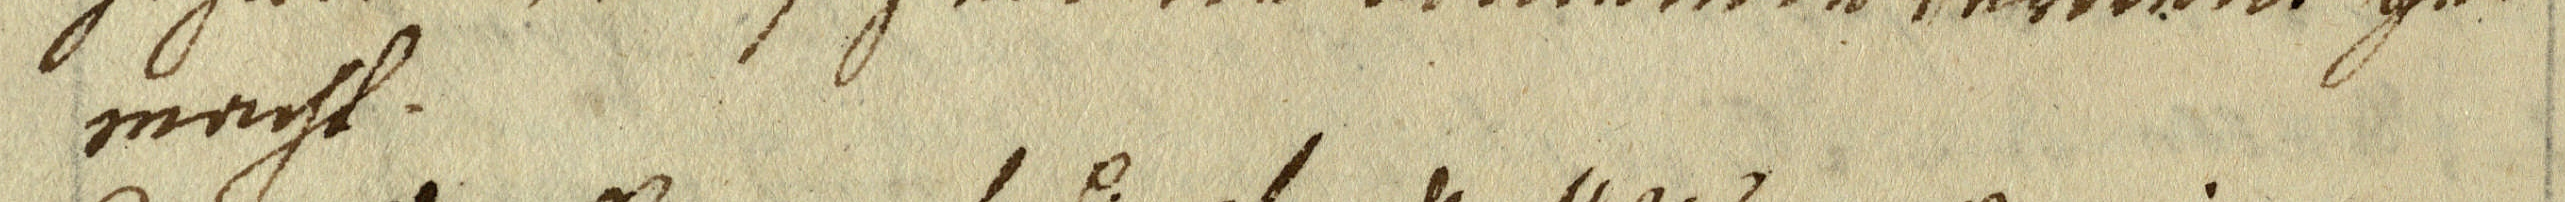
macht.
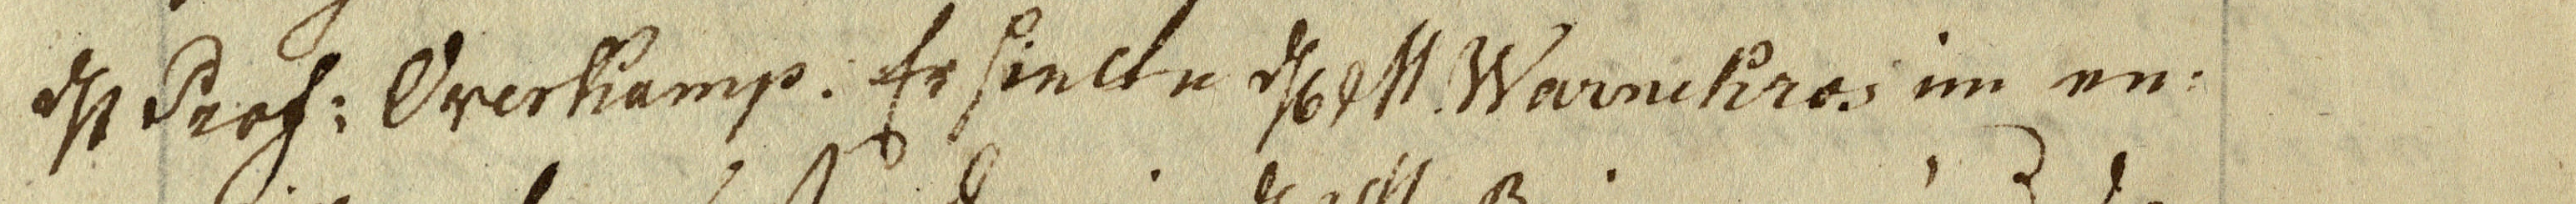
dh Prof. Overkamp. Er hielte dh M. Warnekros im en¬
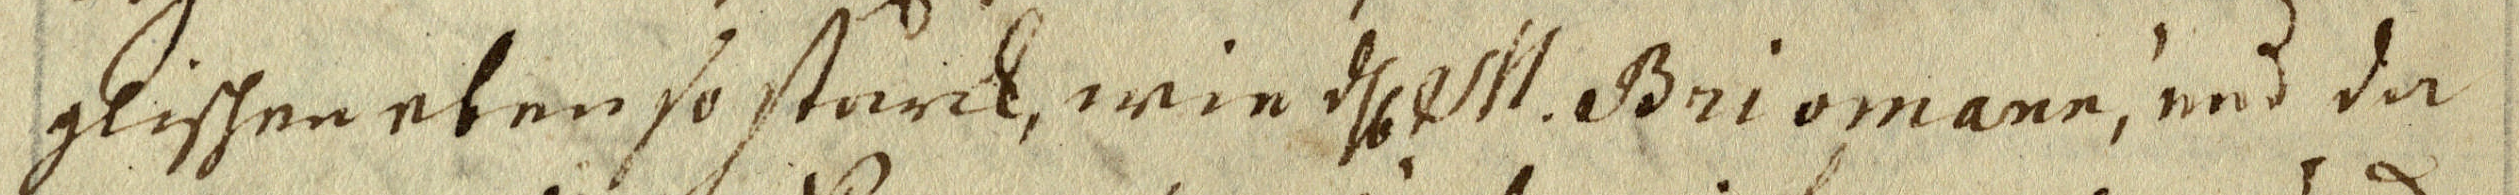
glischen eben so starck, wie dh M. Brismann, und da
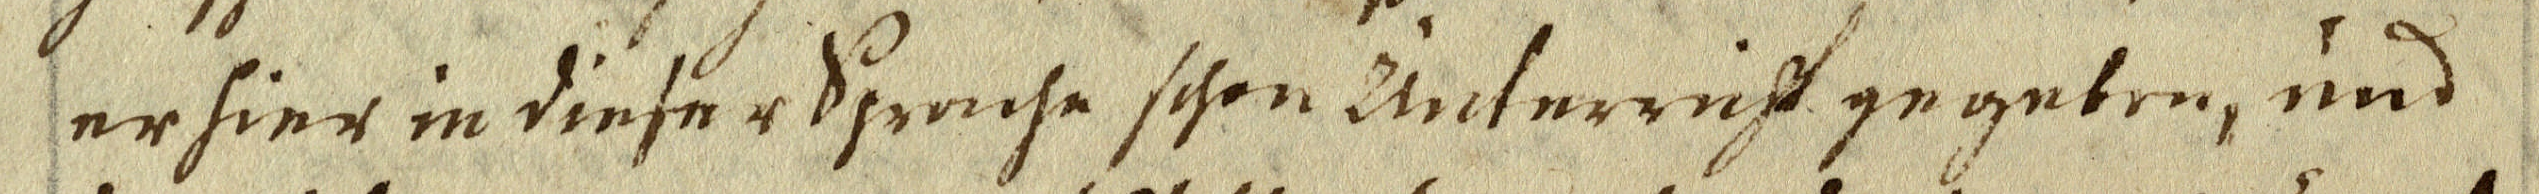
er hier in dieser Sprache schon Unterricht gegeben, und
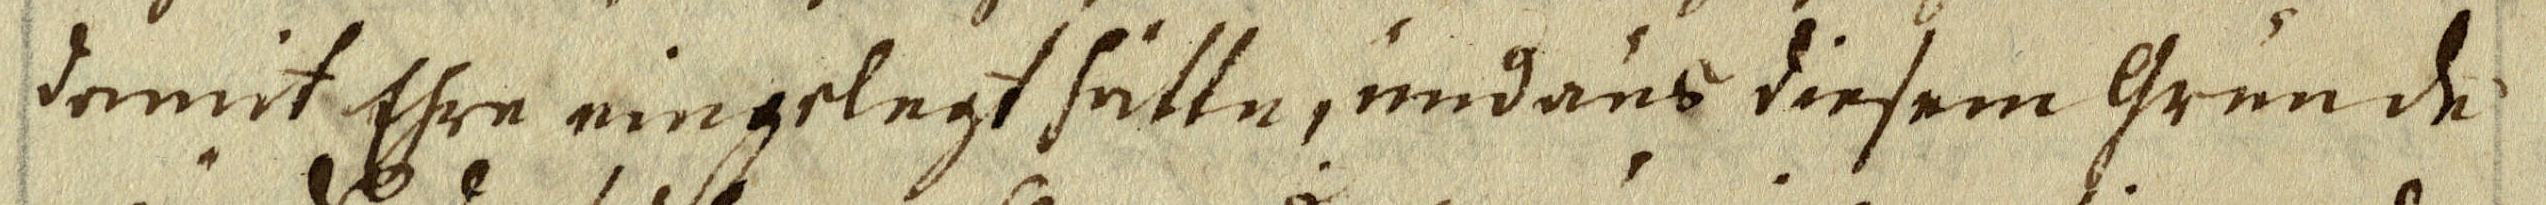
damit Ehre eingelegt hätte, und aus diesem Grunde
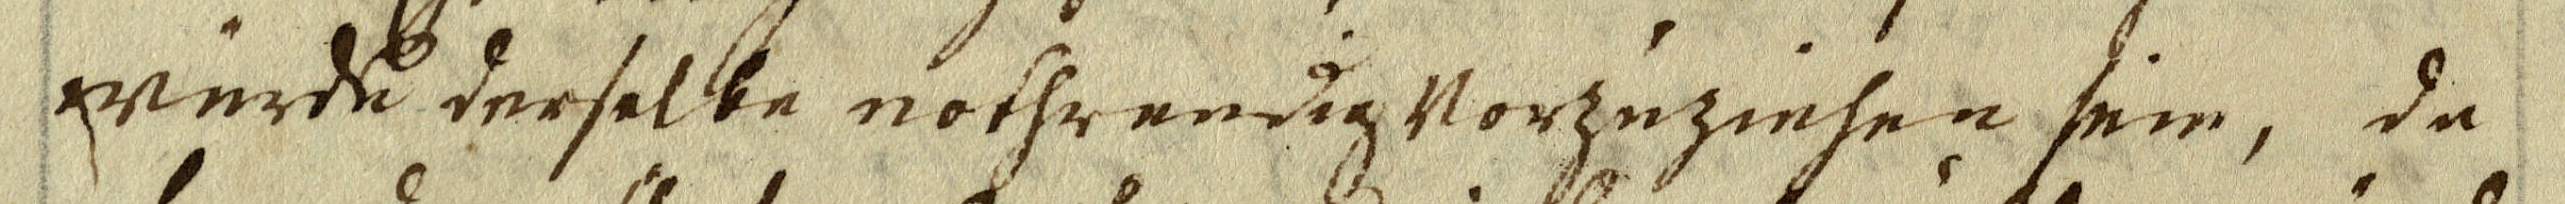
würde derselbe nothwendig vorzuziehen sein, da
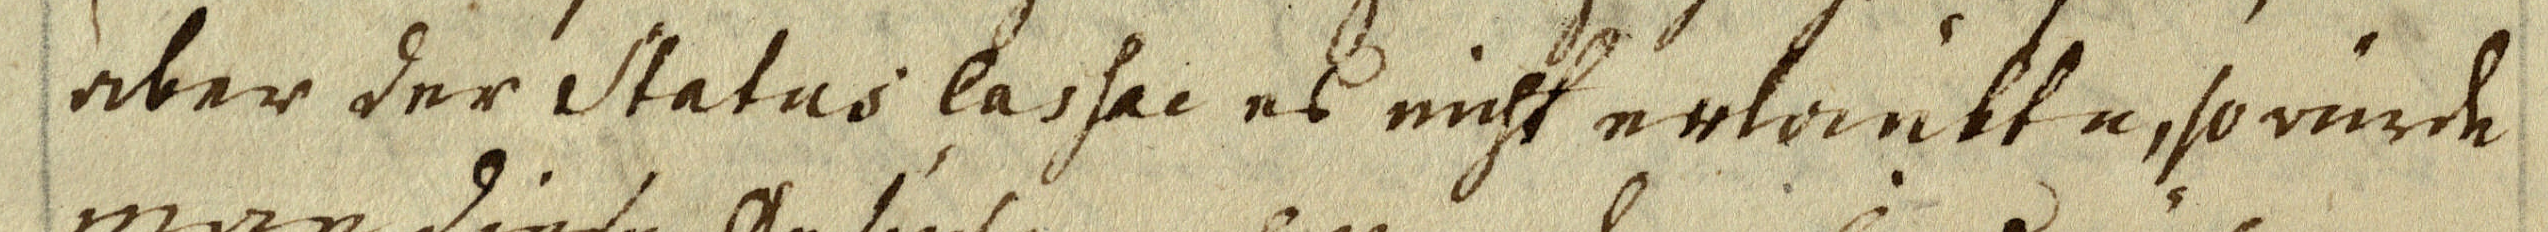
aber der Status Cassae es nicht erlaubte, so würde
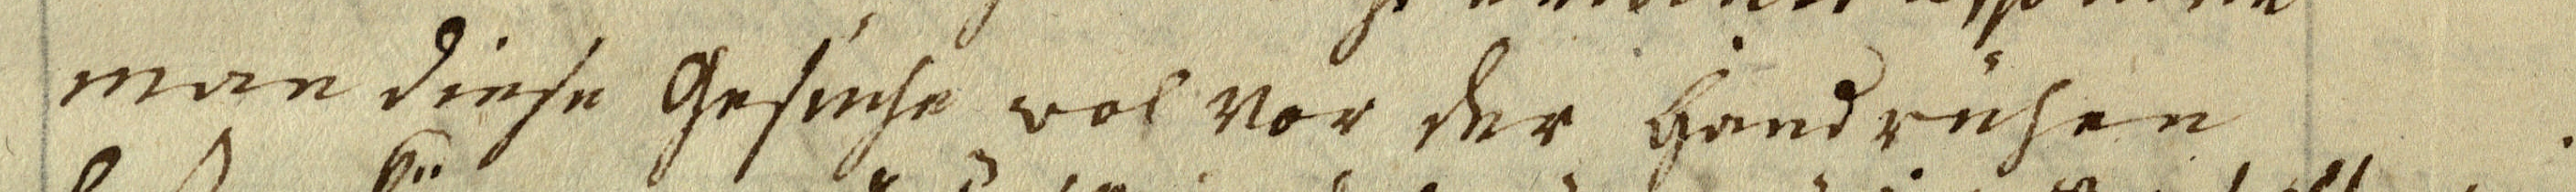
man diese Gesuche wol vor der Hand ruhen
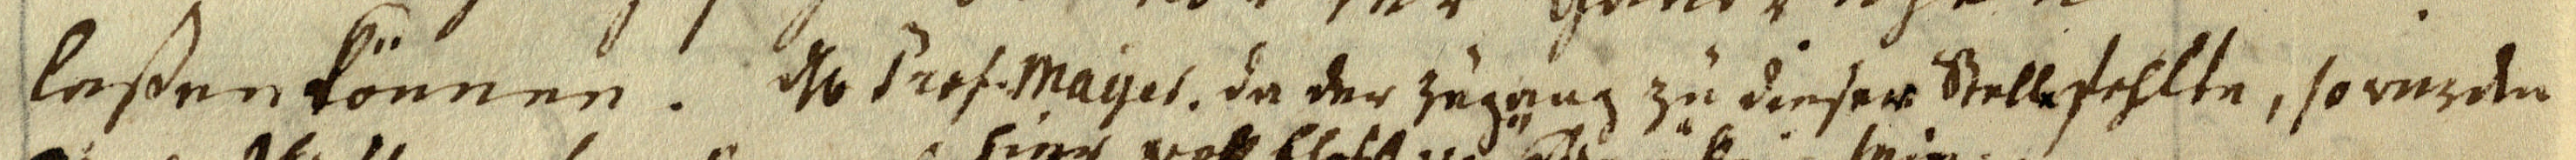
laßen können. dh Prof. Maÿer. Da der Zugang zu dieser Stelle fehlte, so würden
